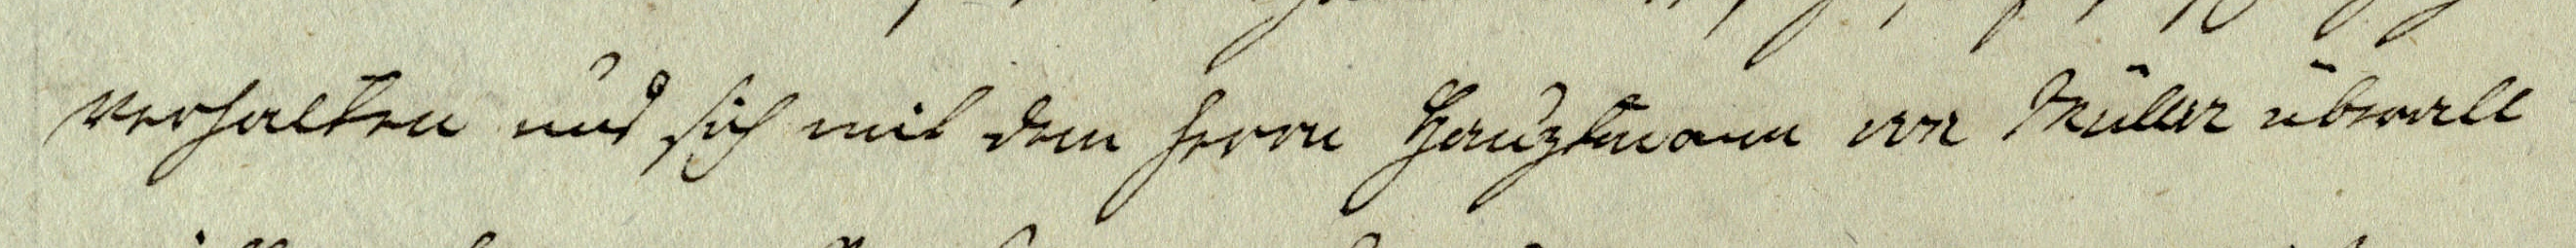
verhalten und sich mit dem Herrn Hauptmann von Müller überall
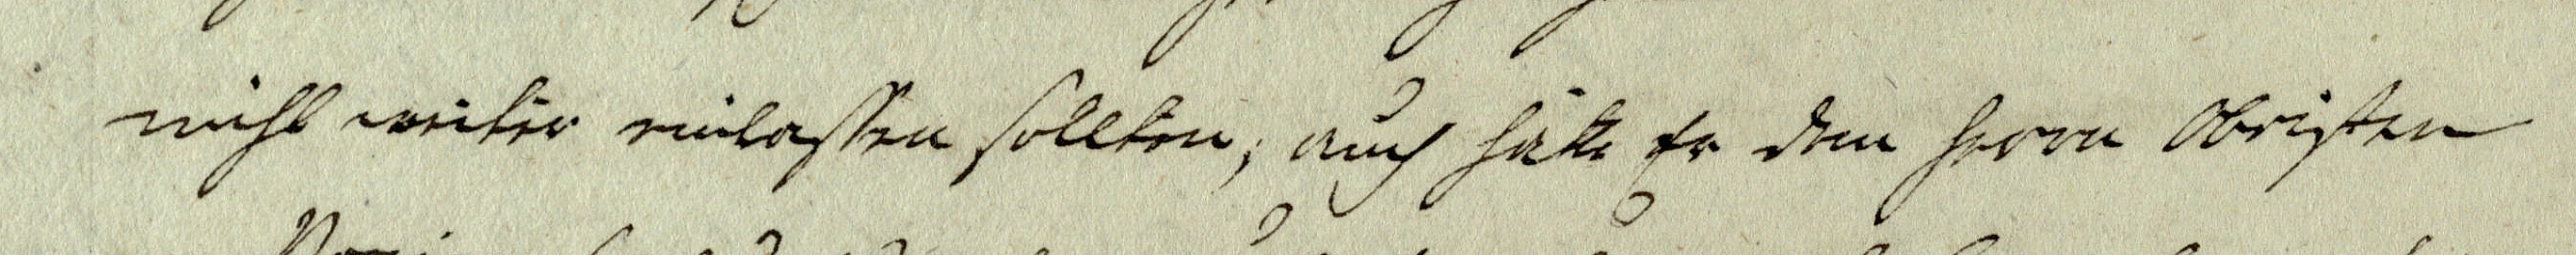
nicht weiter einlassen sollten, auch hätte Er dem Herrn Obristen
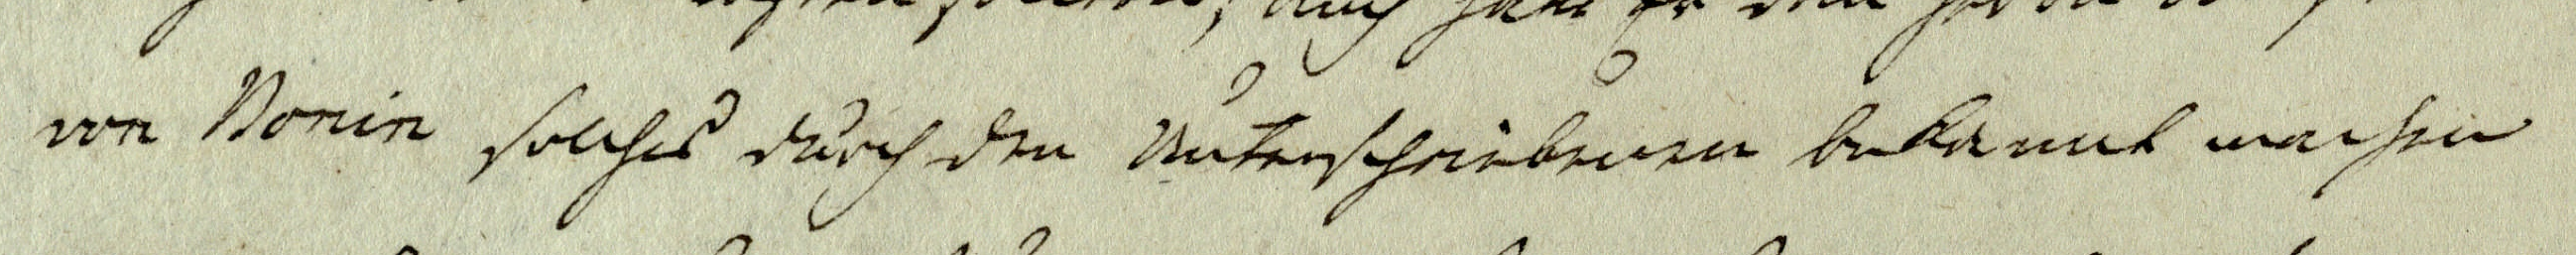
von Bonin solches durch den Unterschriebenen bekannt machen
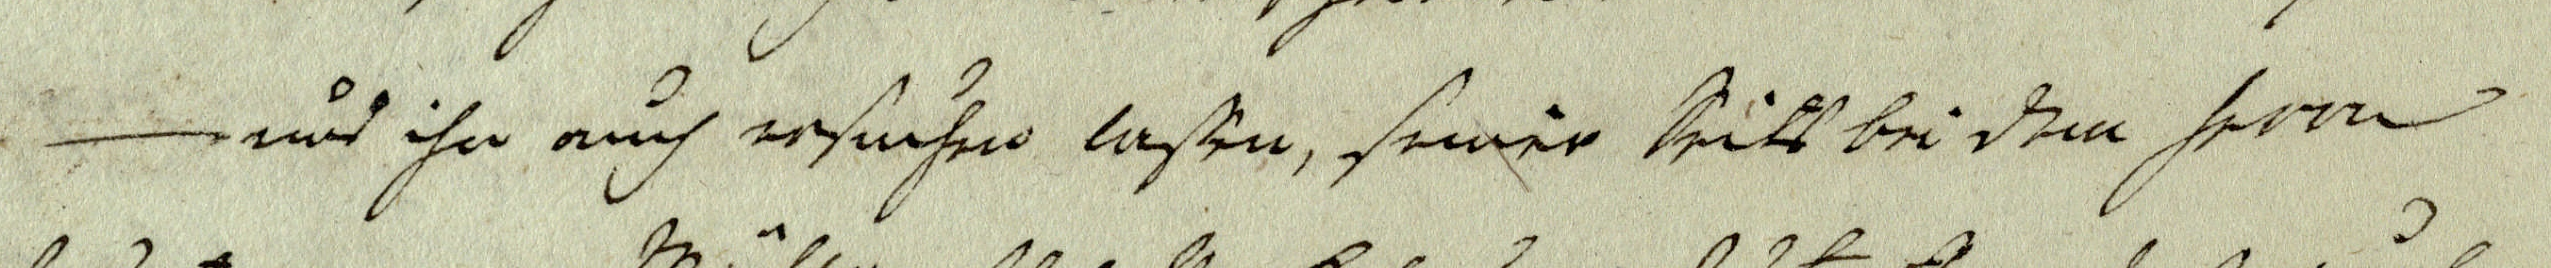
und ihn auch ersuchen lassen, seiner Seits bei dem Herrn
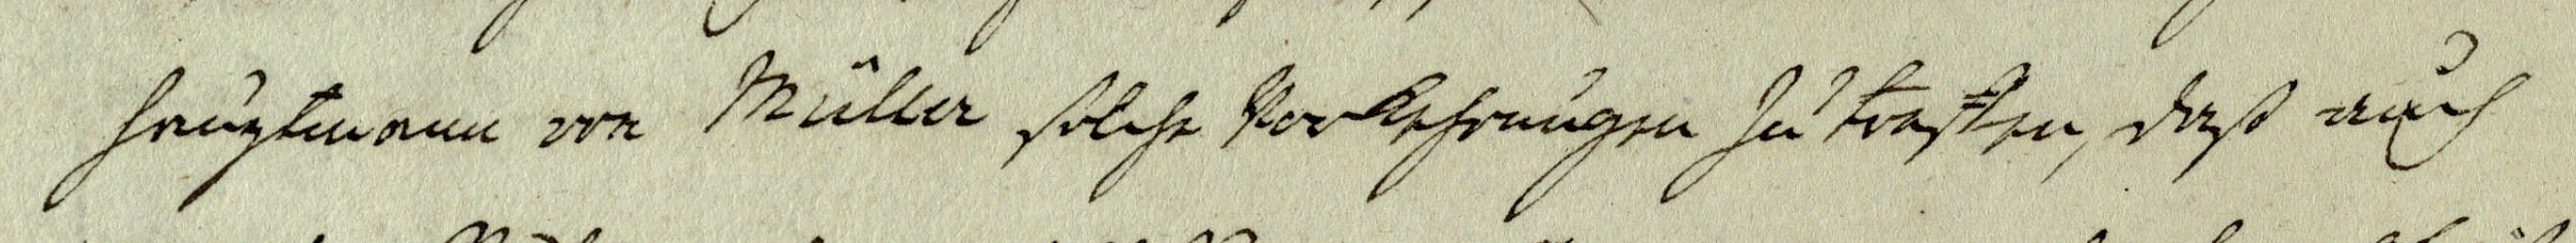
Hauptmann von Müller solche Vorkehrungen zu treffen, daß auch
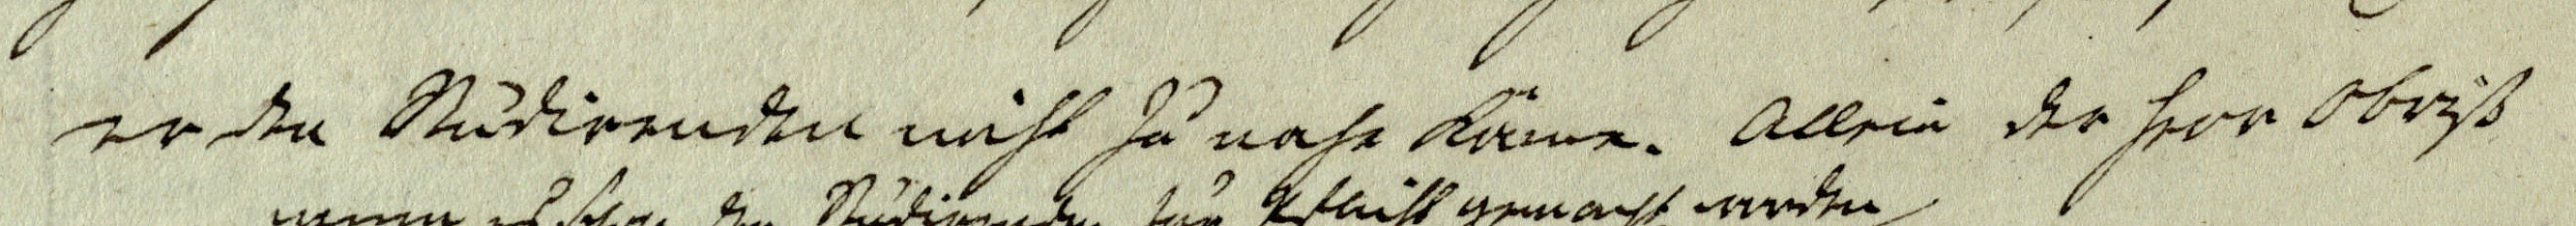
er den Studirenden nicht zu nahe käme. Allein der Herr Obrist
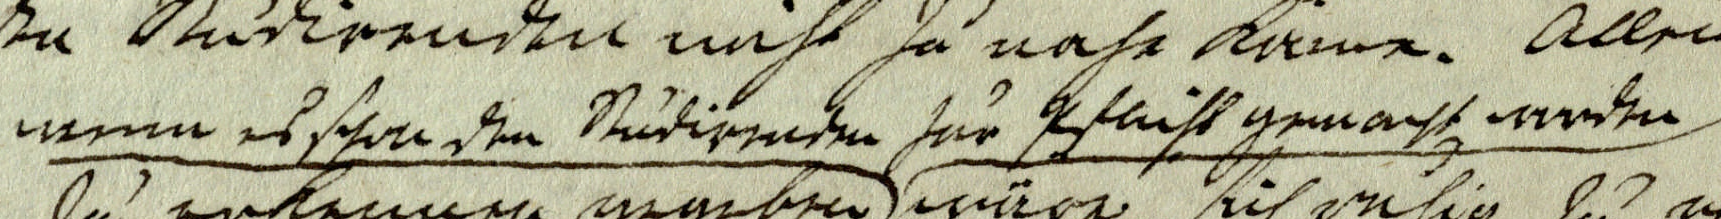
wenn es schon den Studirenden zur Pflicht gemacht worden
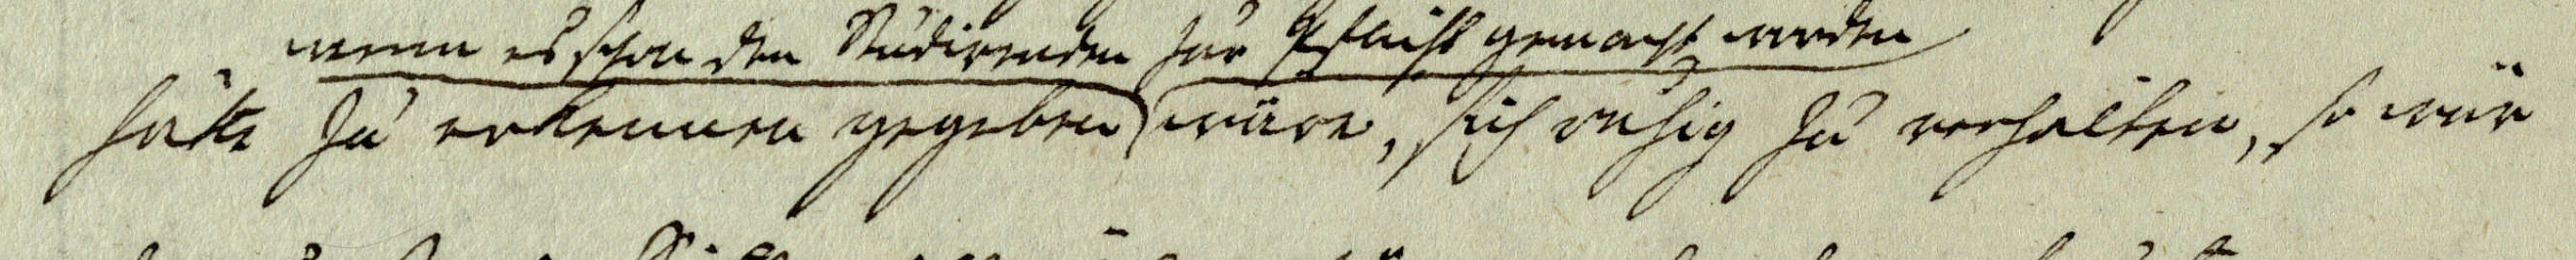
hätte zu erkennen gegeben wäre, sich ruhig zu verhalten, so wär
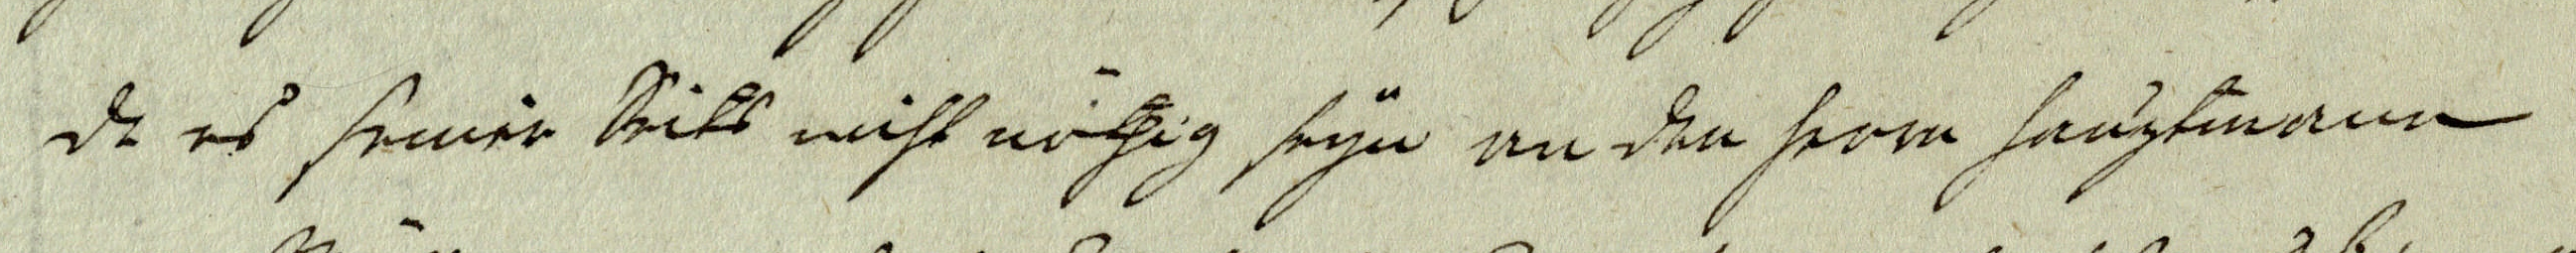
da es seiner Seits nicht nöthig seÿn an den Herrn Hauptmann
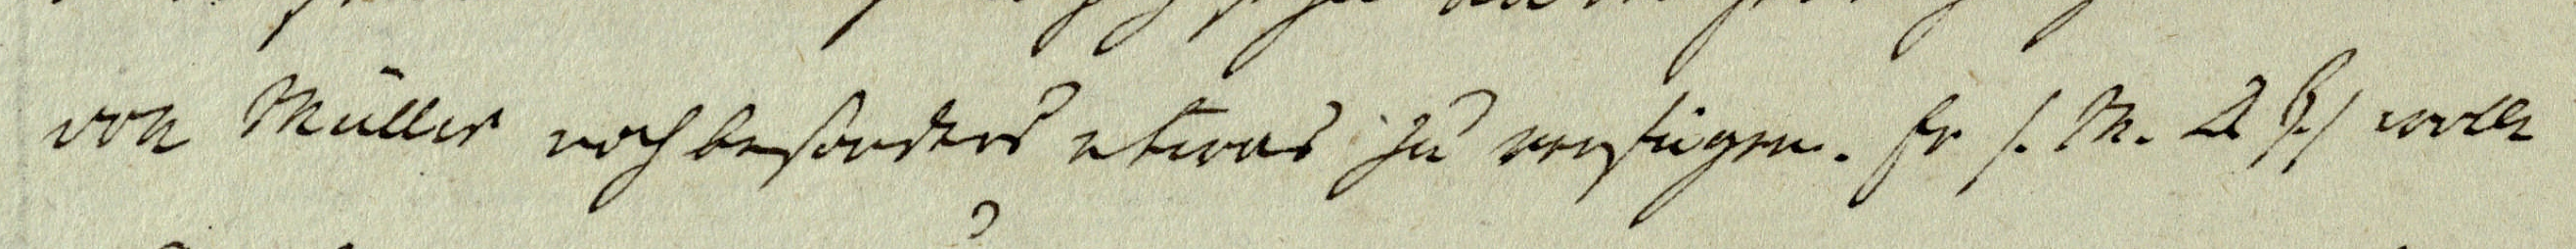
von Müller noch besonders etwas zu verfügen. Er /. M. D. R./ wolle
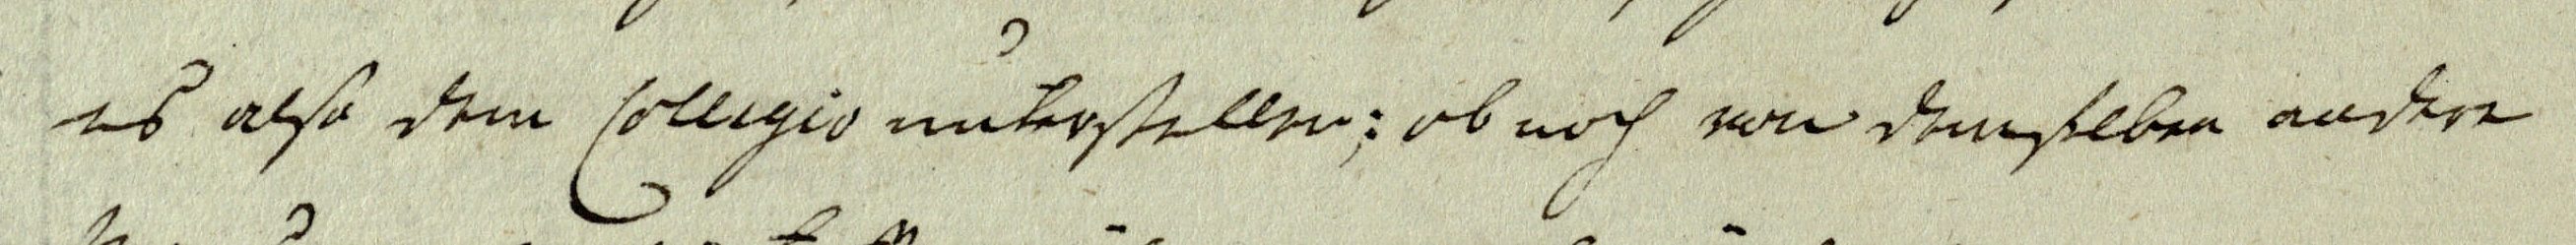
es also dem Collegio unterstellen; ob noch von demselben andere
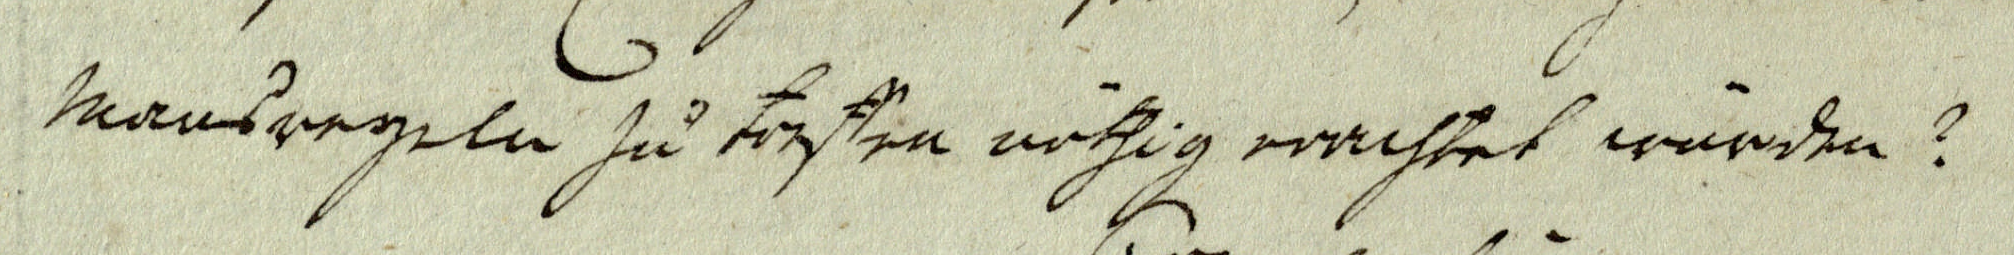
Maasregeln zu treffen nöthig erachtet würden?
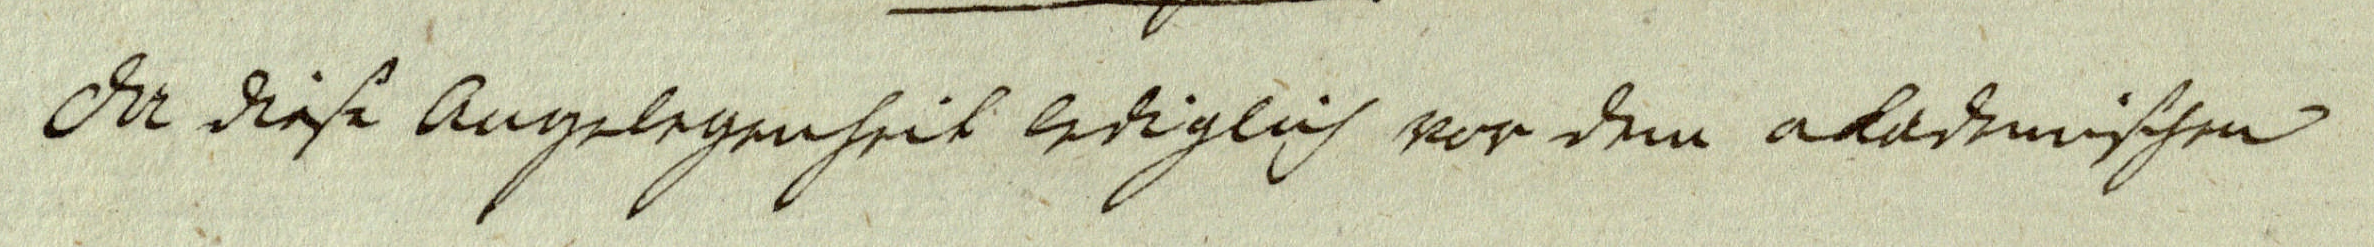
Da diese Angelegenheit lediglich vor dem akademischen
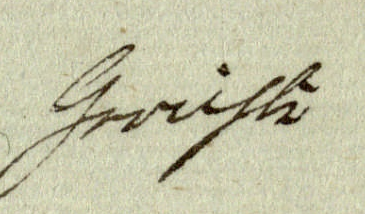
Gerichte
